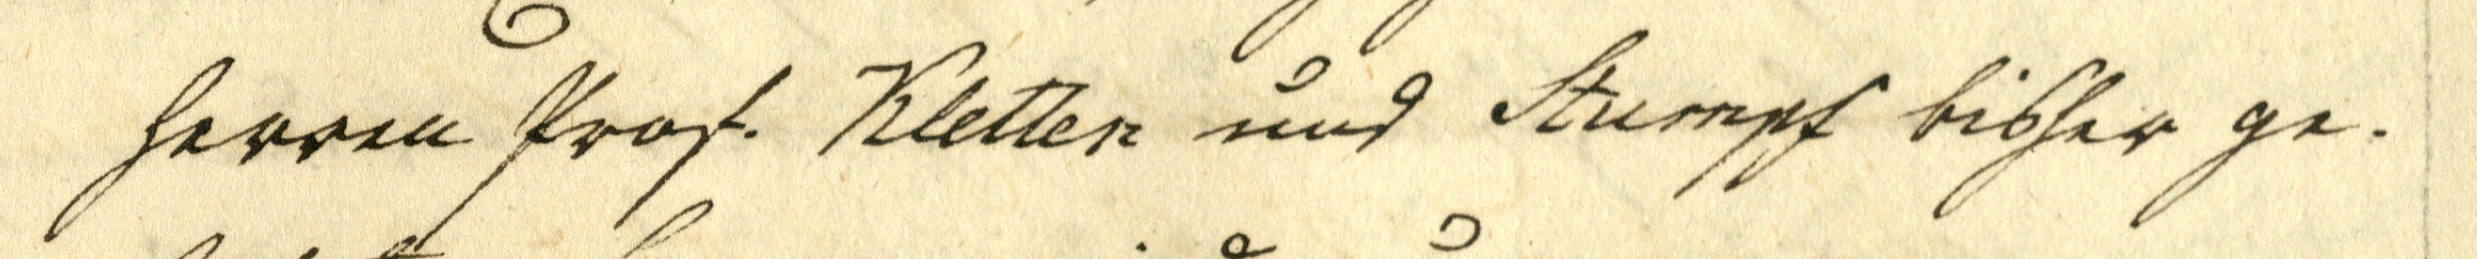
Herren Prof. Kletten und Stumpf bisher ge¬
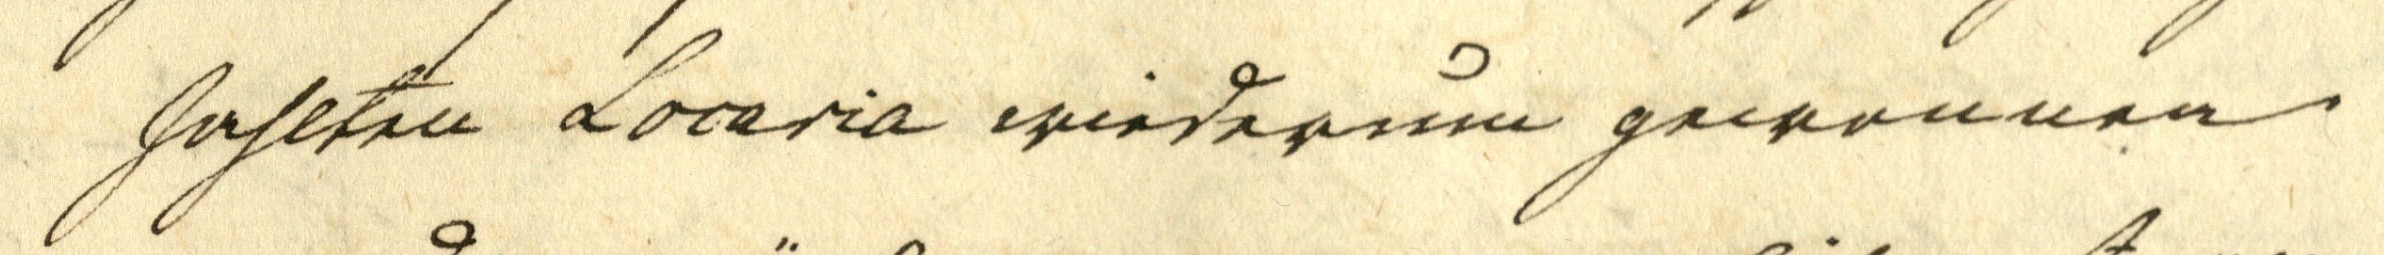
zahlten Locaria wiederum gewonnen
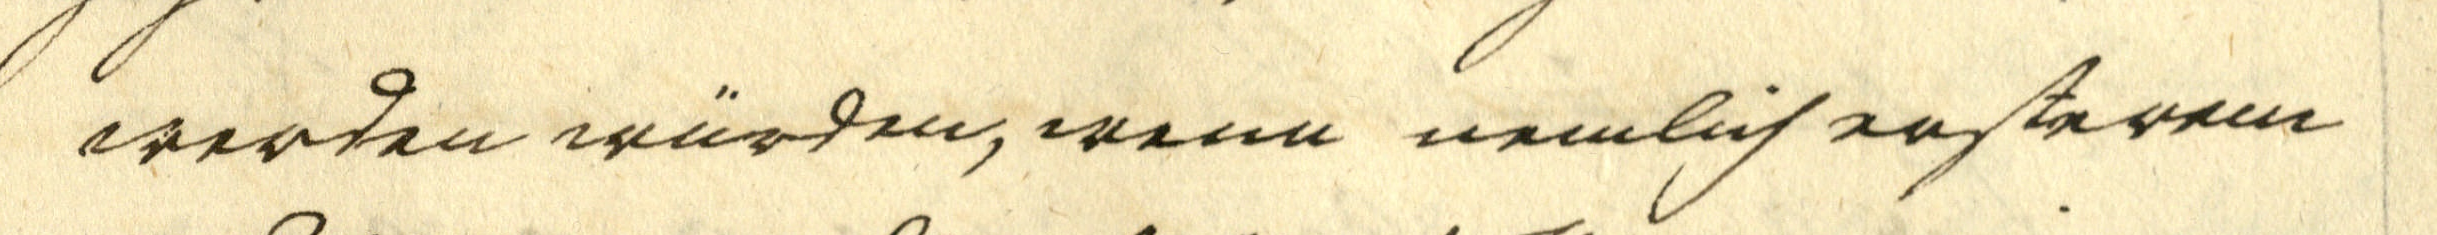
werden würden, wenn nemlich ersterem
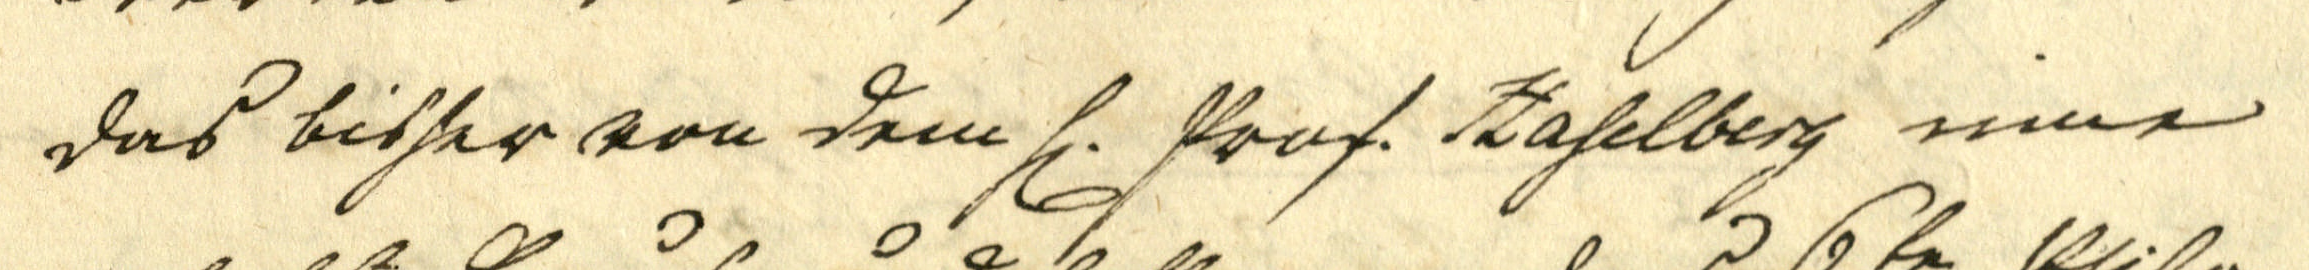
das bisher von dem H. Prof. Haselberg eine
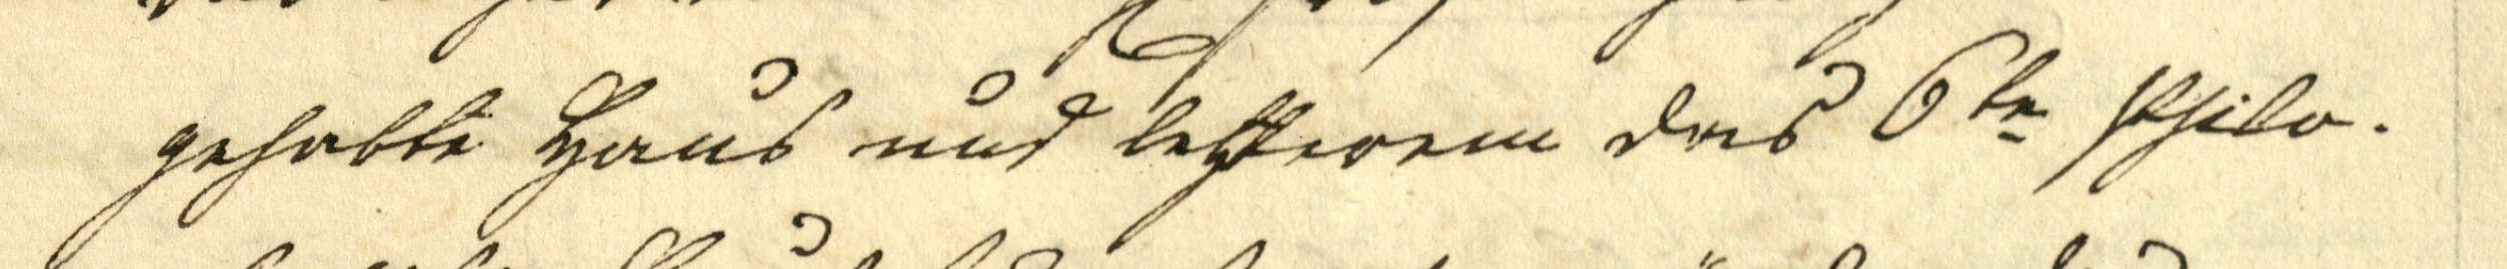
gehabte Haus und letzterem das 6 te Philo¬
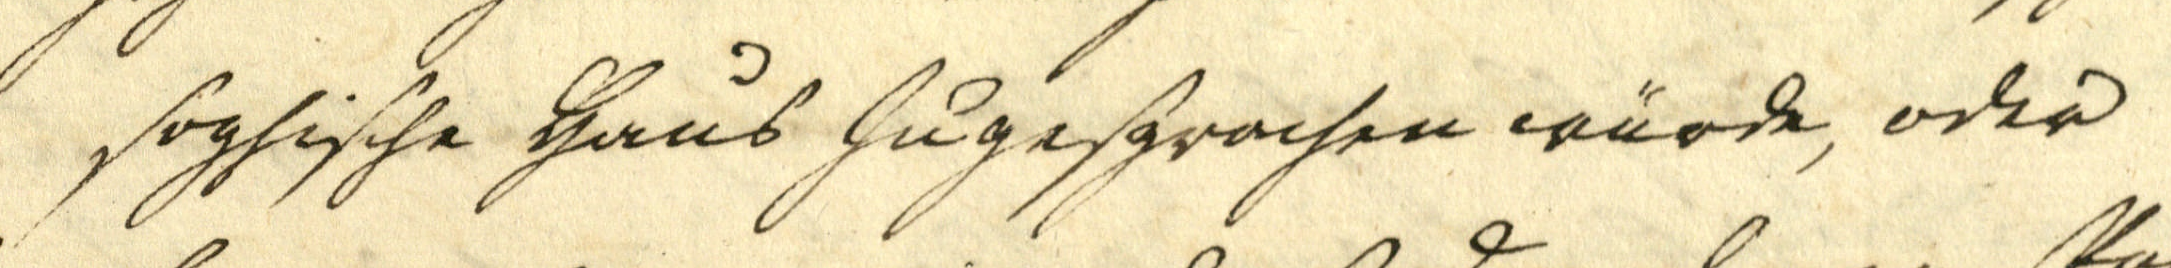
sophische Haus zugesprochen würde, oder
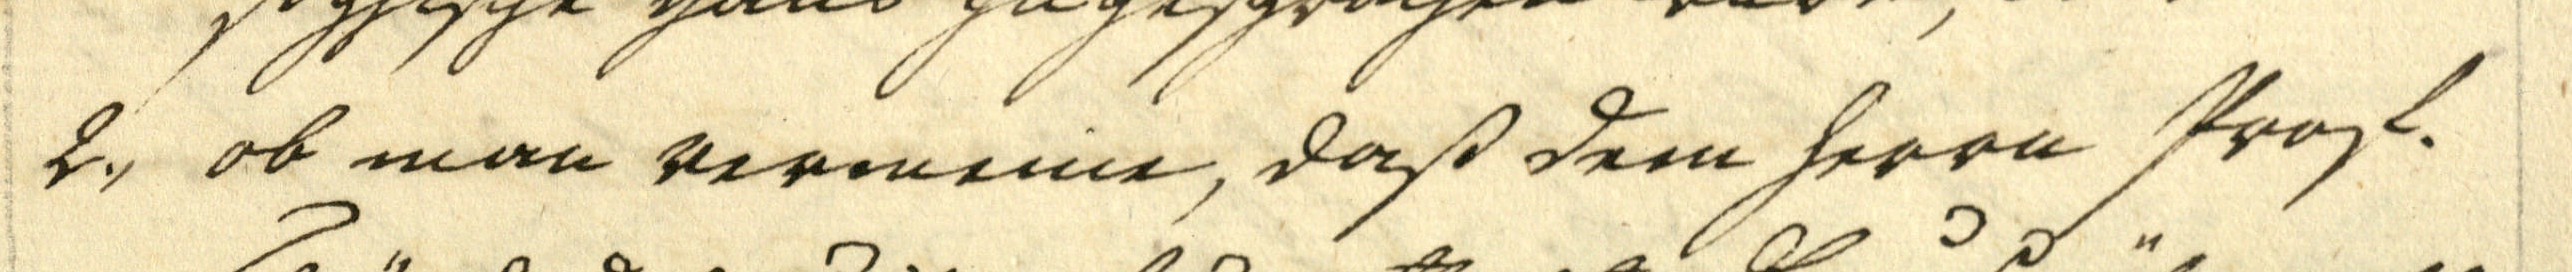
2., ob man vermeine, daß dem Herrn Prof.
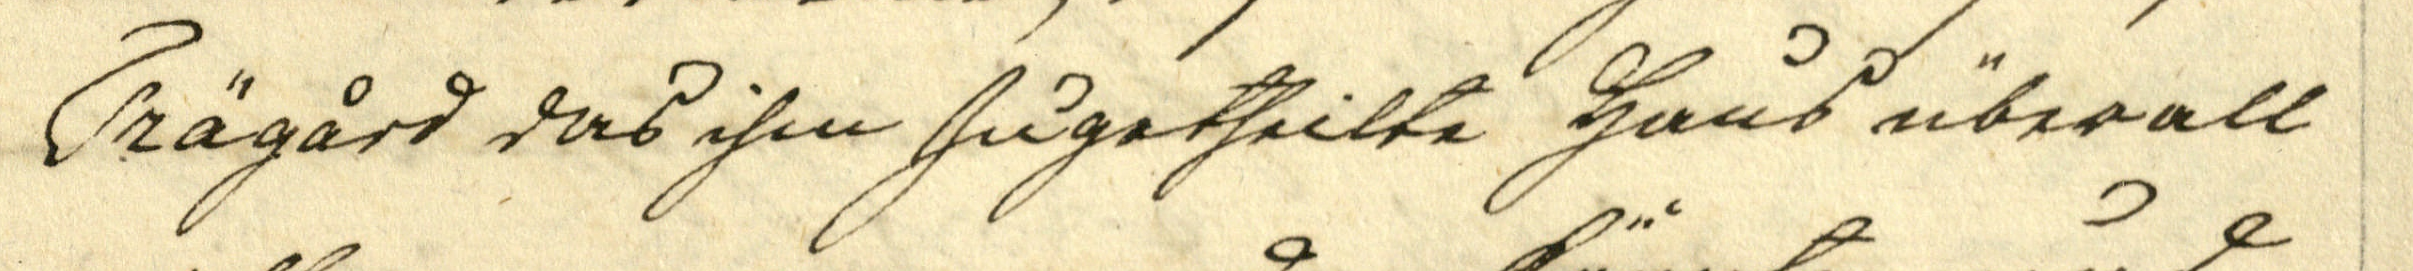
Trägård das ihm zugetheilte Haus überall
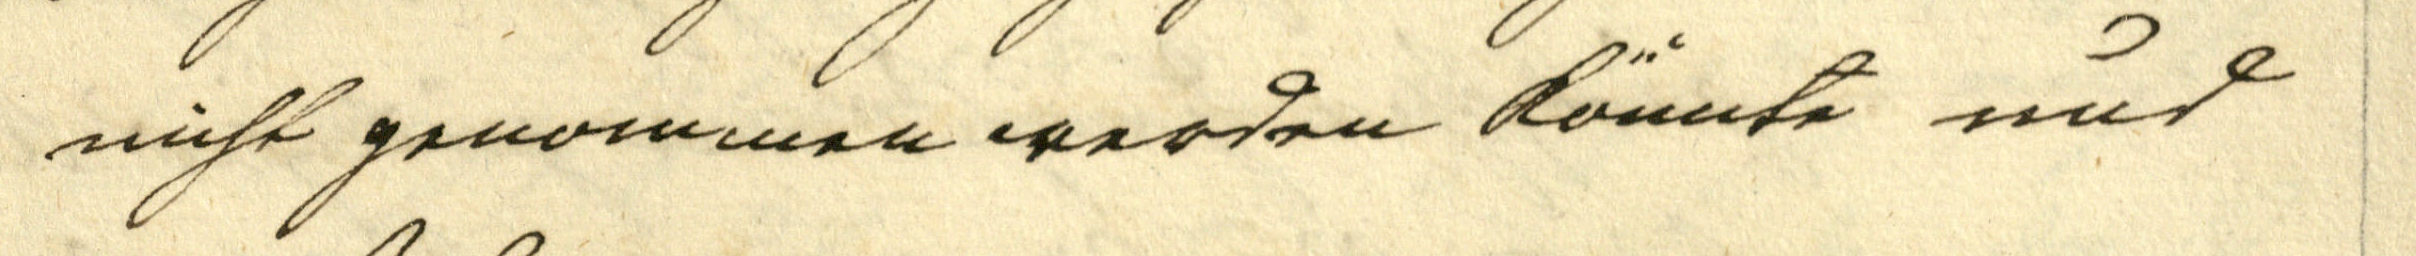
nicht genommen werden könnte und
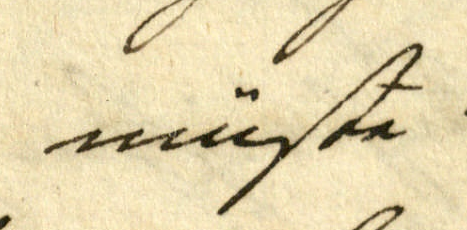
müßte?
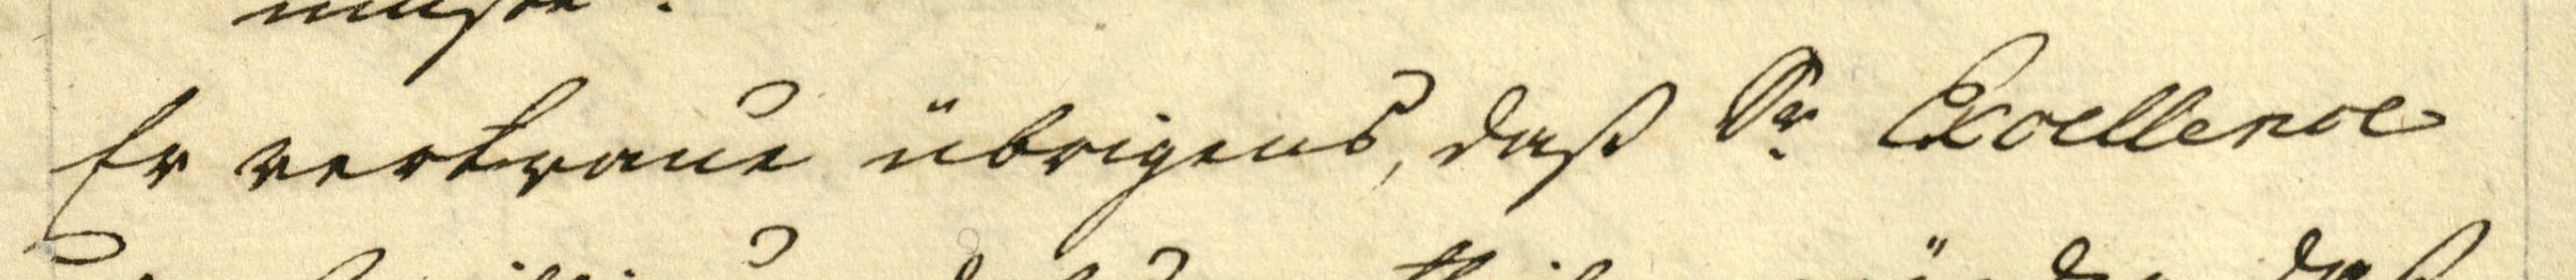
Er vertraue übrigens, daß Sr Excellence
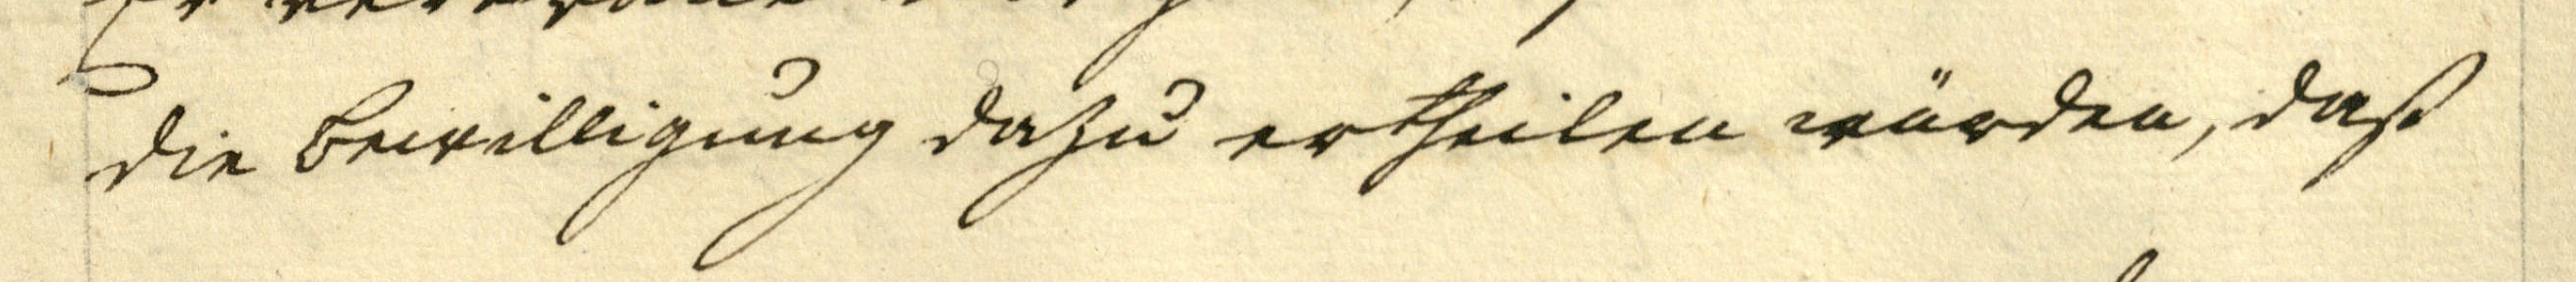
die Bewilligung dazu ertheilen würden, daß
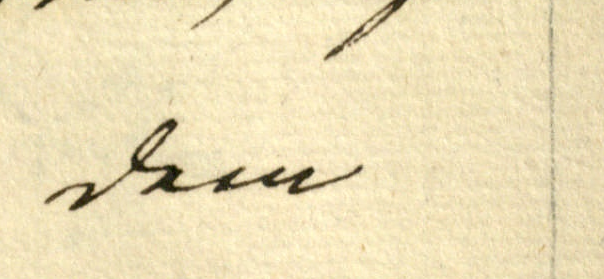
dem
